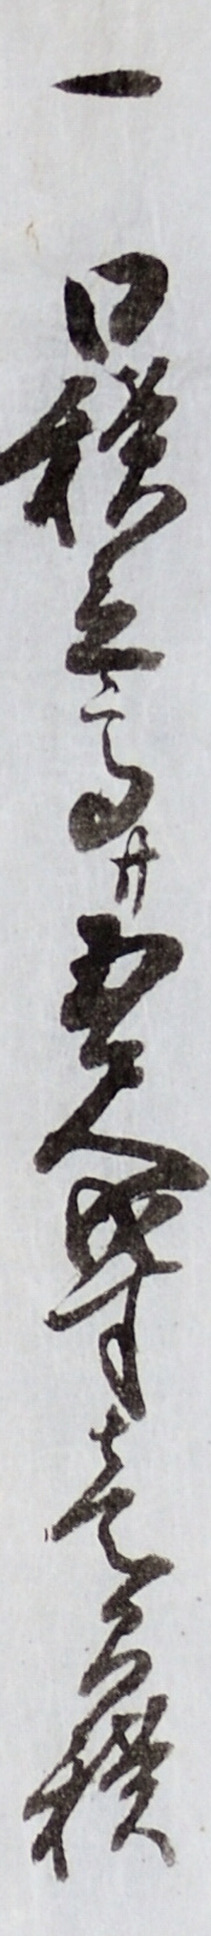一口積立高サ五尺弐寸壱間積
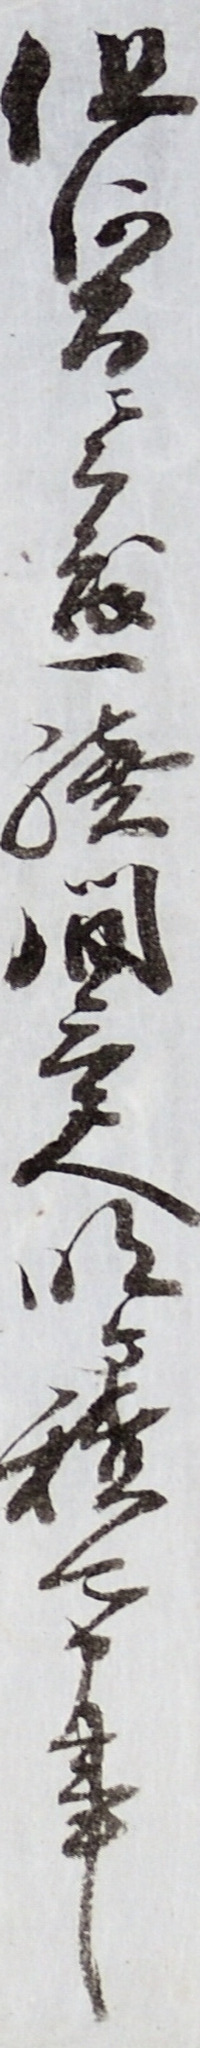但何方ニ而茂一続間三尺明ヶ積可申候事
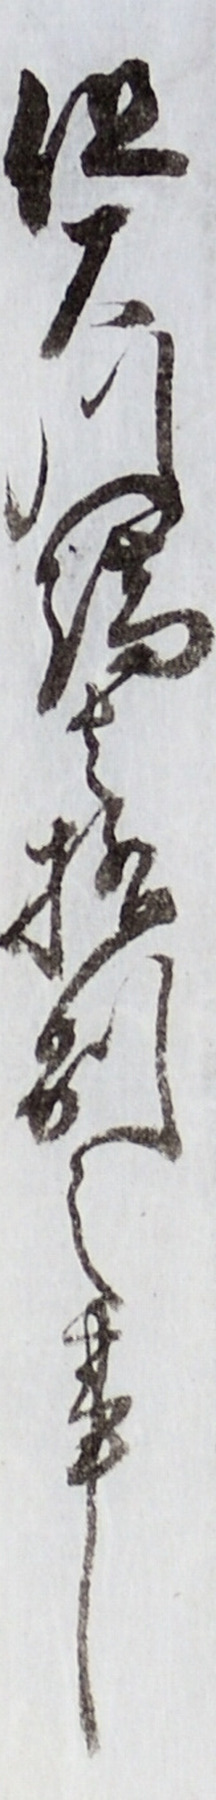但大川端者格別之事
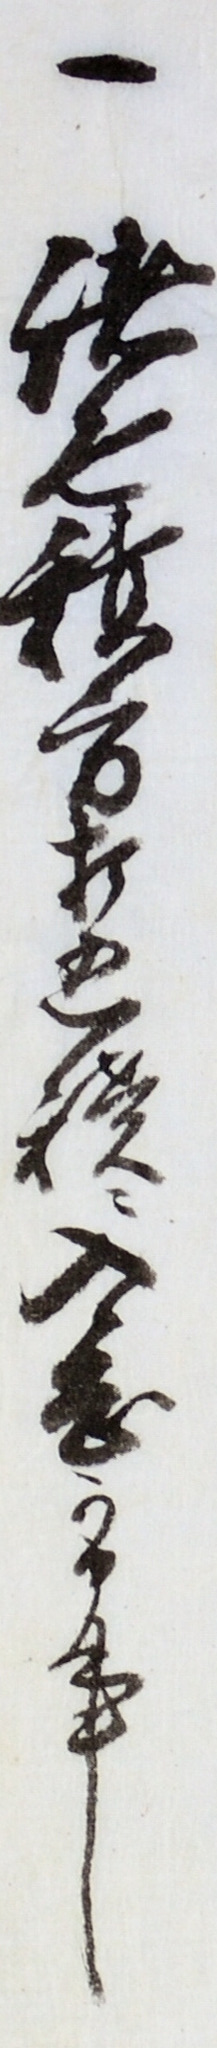一諸色積方打込積ニ入念可申事
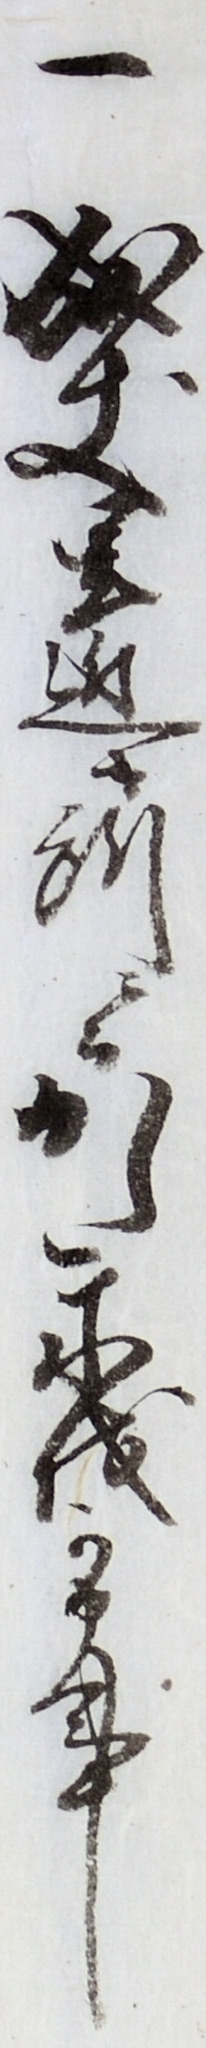一成丈里近キ所ニ而かた木伐可申事
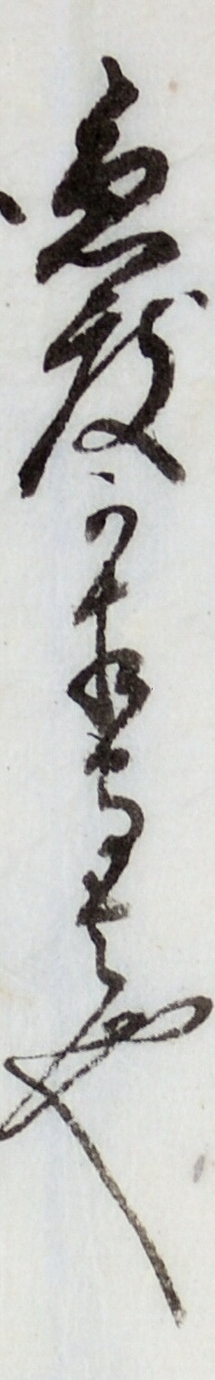急度可相守者也
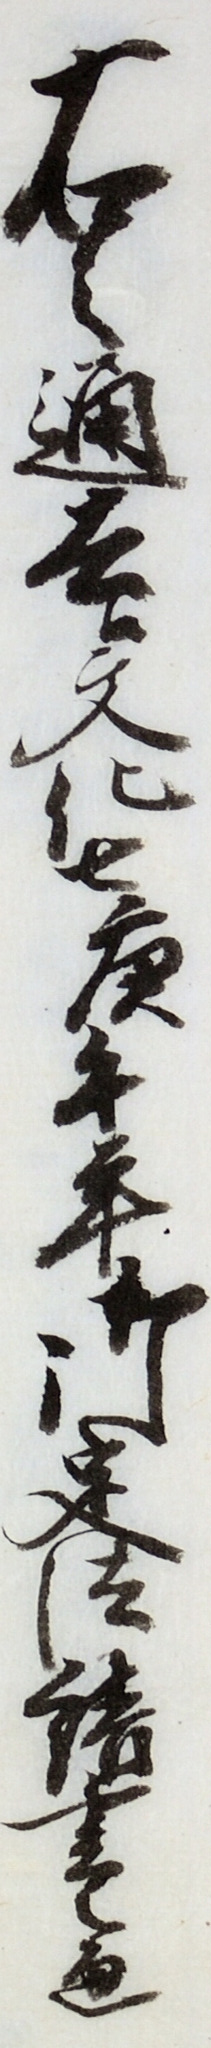右之通去ル文化七庚午年御定法請書之通
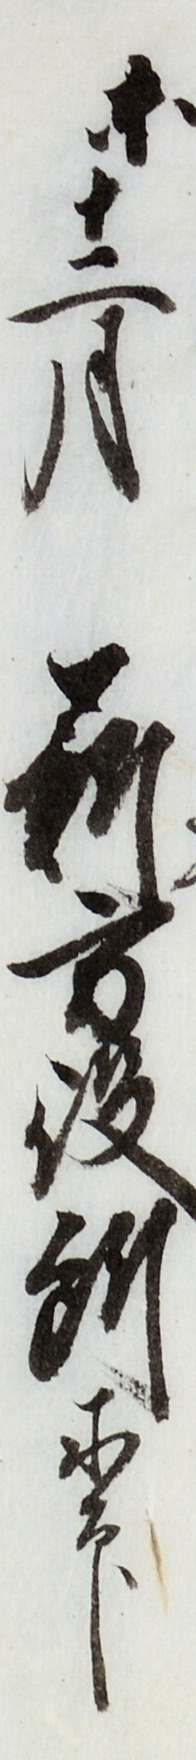未十二月薪方役所木印
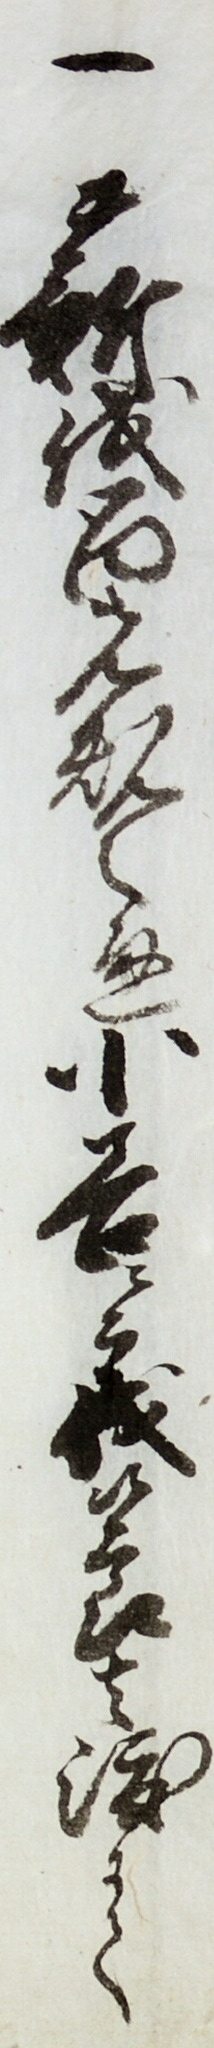一薪伐百先規之通小善ニ而伐候節者渡にて
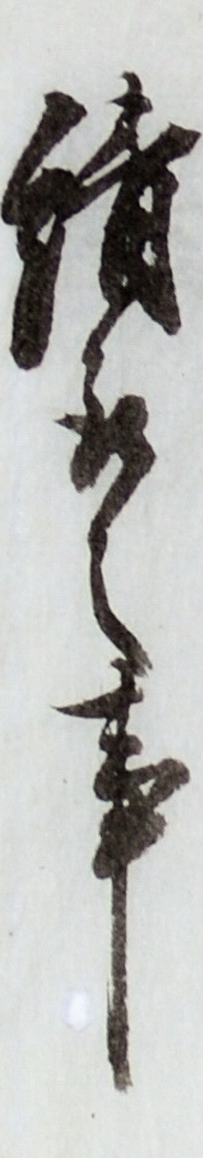請取之事

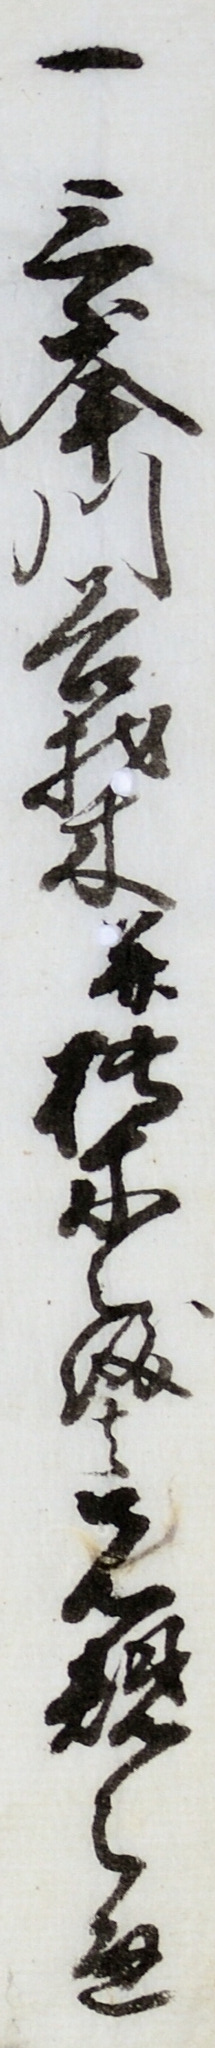一三峯川谷伐木并樽木之儀者先規之通
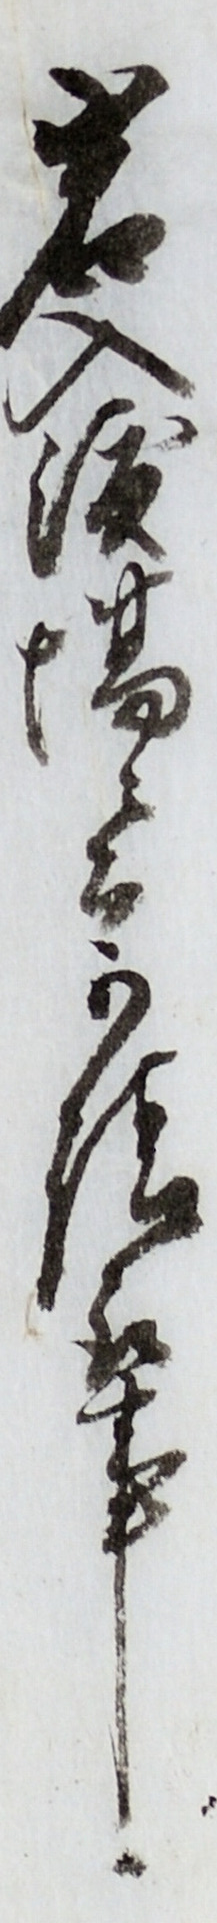岩入渡場ニ而可請取事
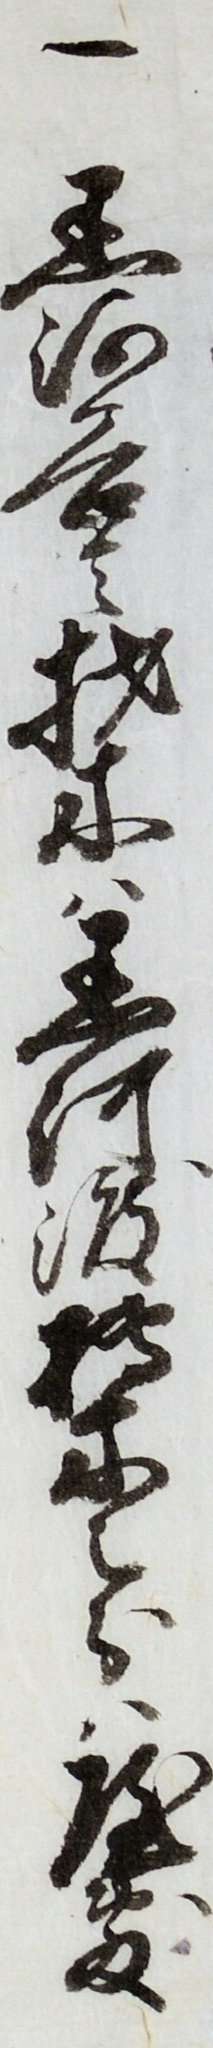一黒河谷ニ伐木ハ黒河渡樽木之分ハ屋敷
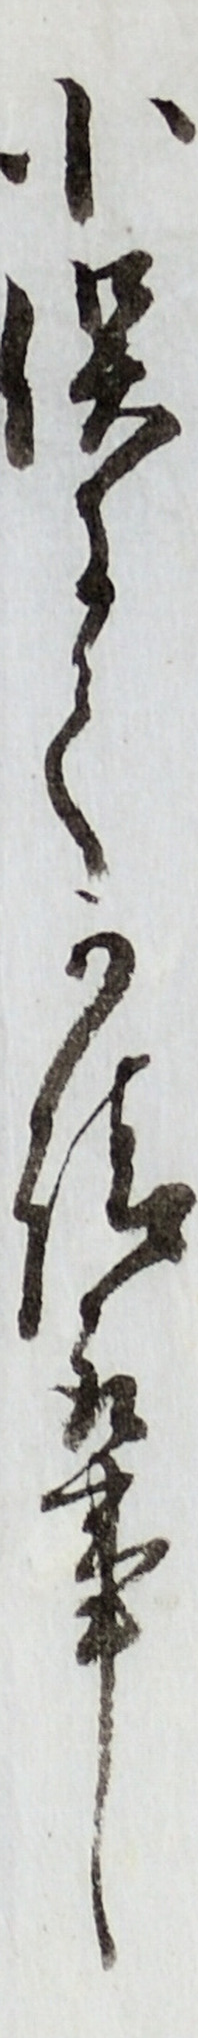小俣にて可請取事
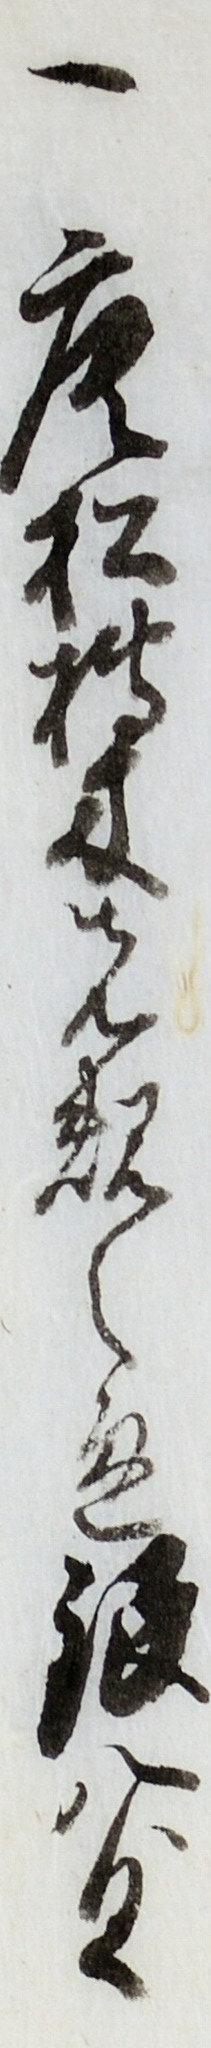一唐松樽木先規之通銀八匁
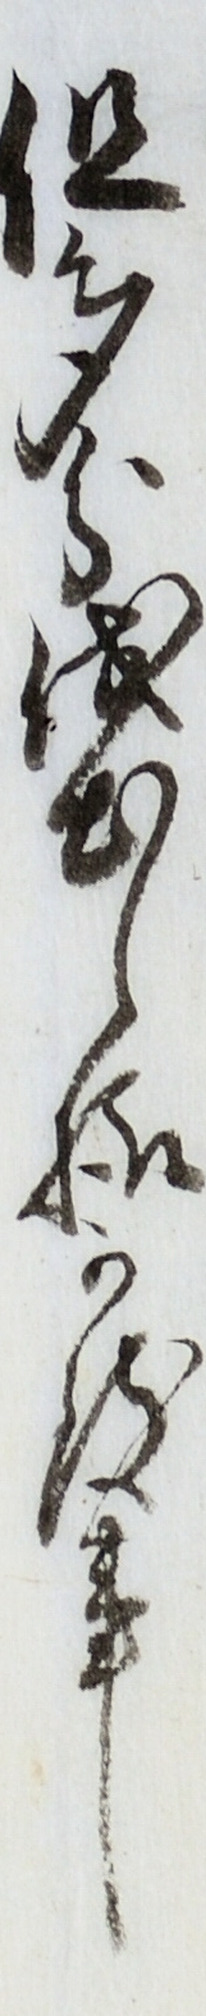但多分伐出し候様可致事
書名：御薪方掟控
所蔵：伊那市立高遠町図書館・合同会社AMANE
